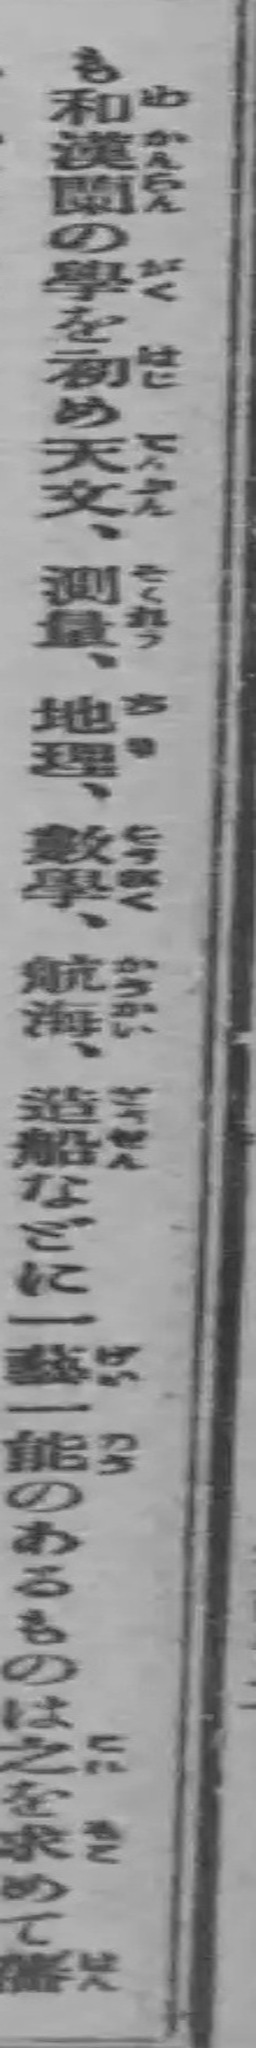も和漢蘭の学を初め天文、測量、地理、数学、航海、造船などに一芸一能のあるものは之を求めて藩
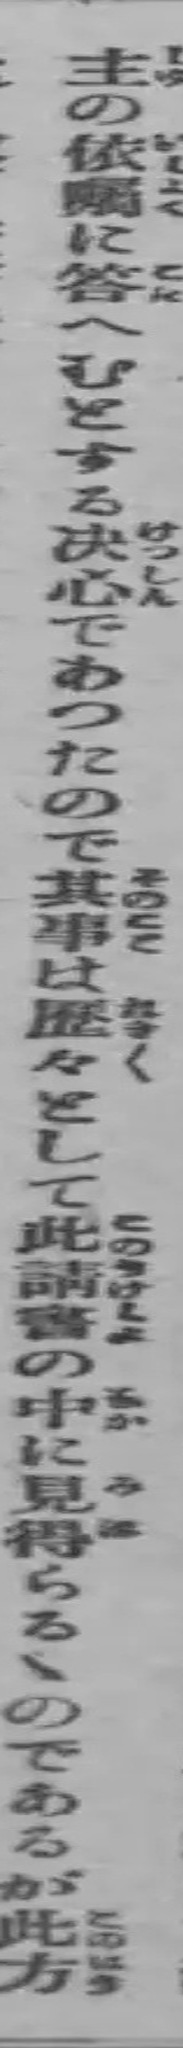主の依嘱に答へむとする決心であつたので其事は歴々として此請書の中に見得らるゝのであるが此方
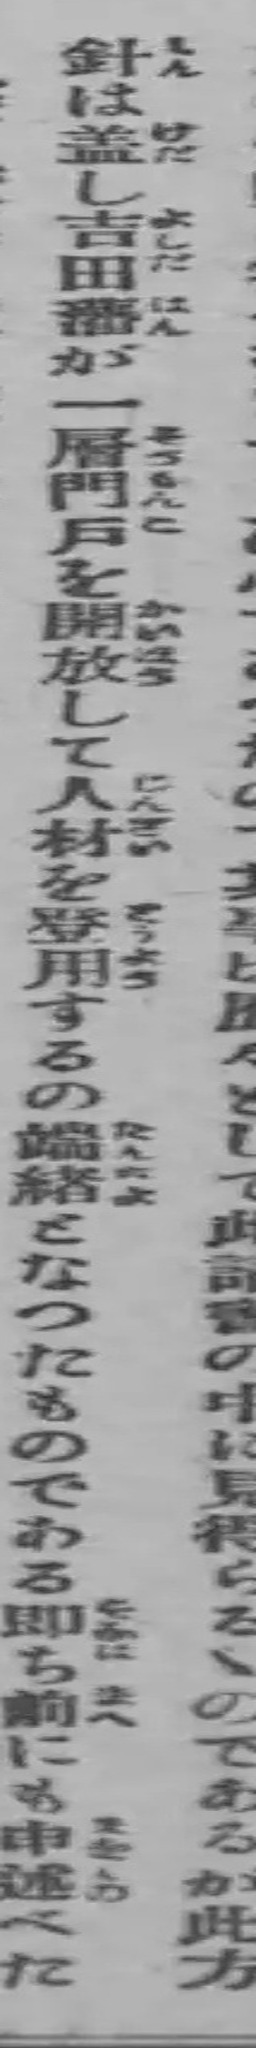針は蓋し吉田藩が一層門戸を開放して人材を登用するの端緒となつたものである即ち前にも申述べた
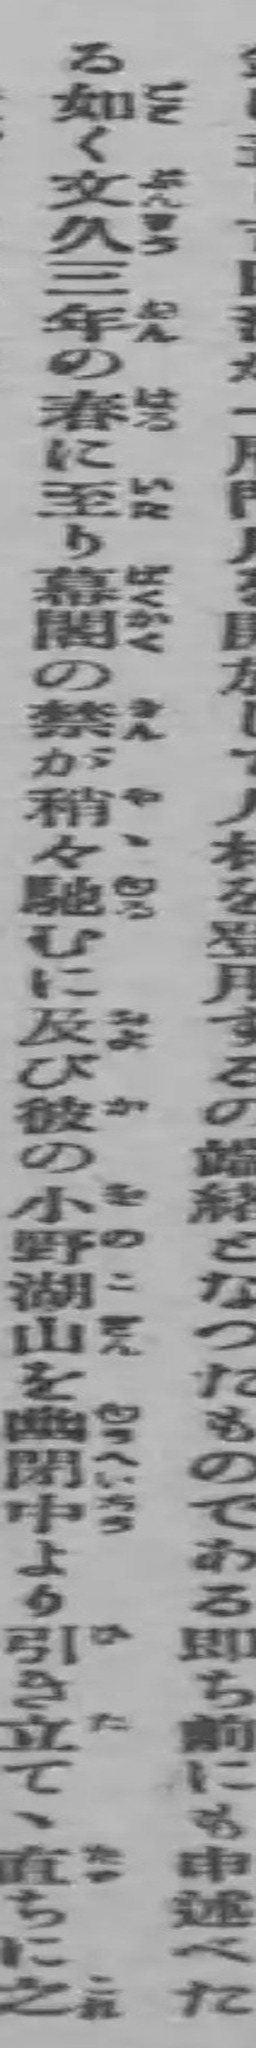る如く文久三年の春に至り幕閣の禁が稍々馳むに及び彼の小野湖山を幽閉中より引き立てゝ直ちに之
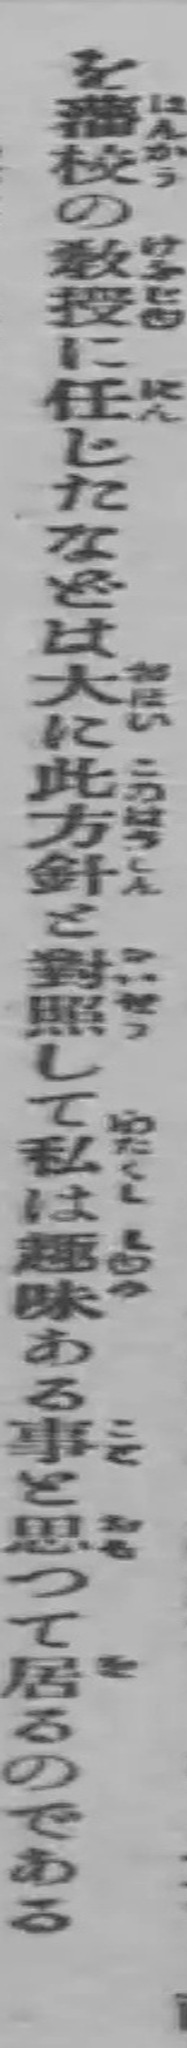を藩校の教授に任じたなどは大に此方針と対照して私は趣味ある事と思つて居るのである
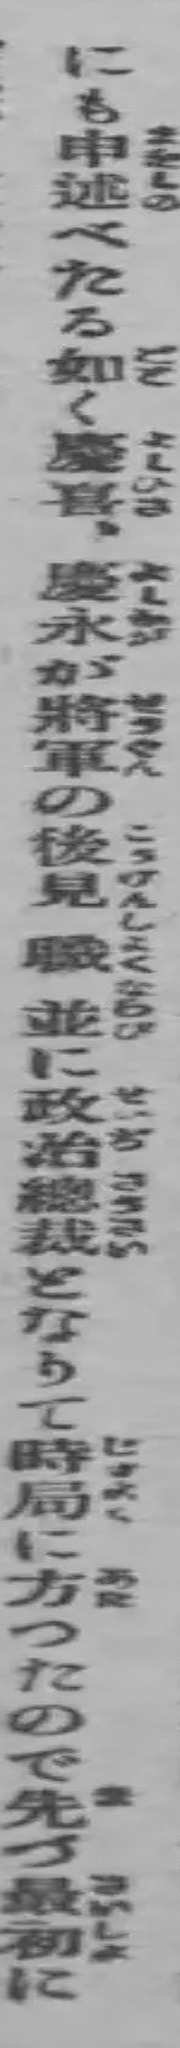にも申述べたる如く慶喜、慶永が将軍の後見職並に政事総裁となりて時局に方つたので先づ最初に
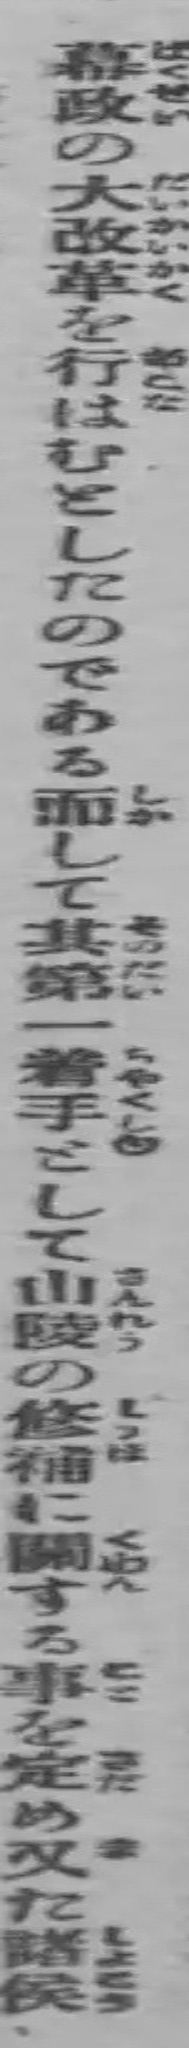幕政の大改革を行はむとしたのである而して其第一着手として山陵の修補に関する事を定め又た諸侯
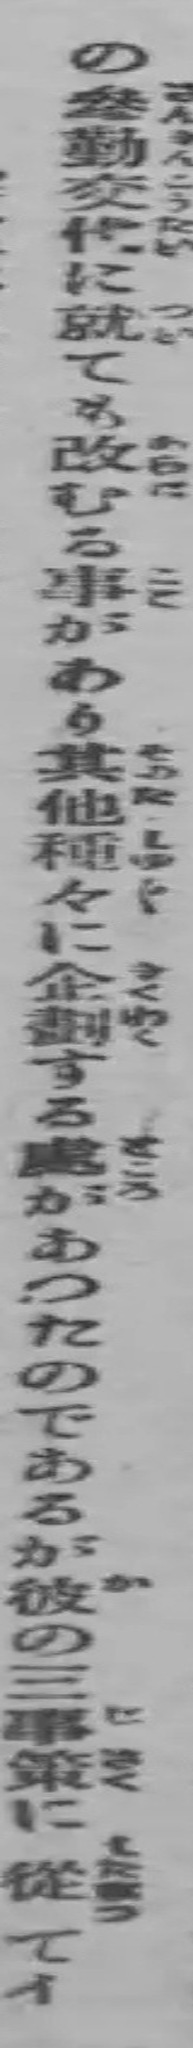の参勤交代に就ても改むる事があり其他種々に企画する処があつたのであるが彼の三事策に従てイ
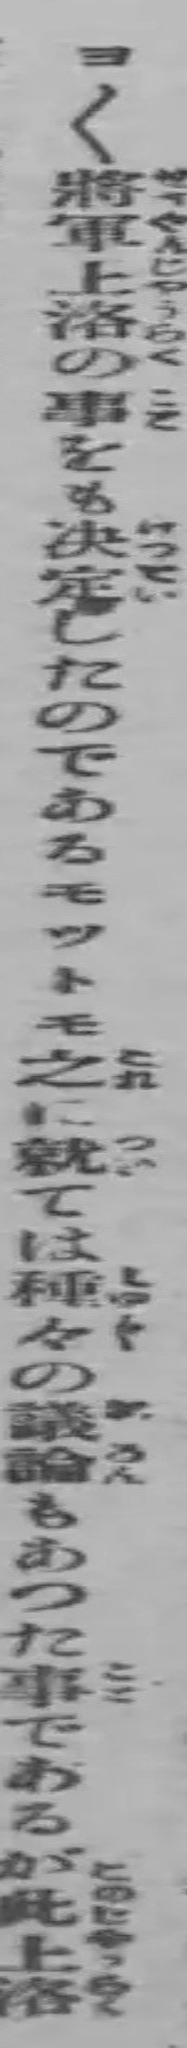ヨ〳〵将軍上洛の事をも決定したのであるモツトモ之に就ては種々の議論もあつた事であるが此上洛
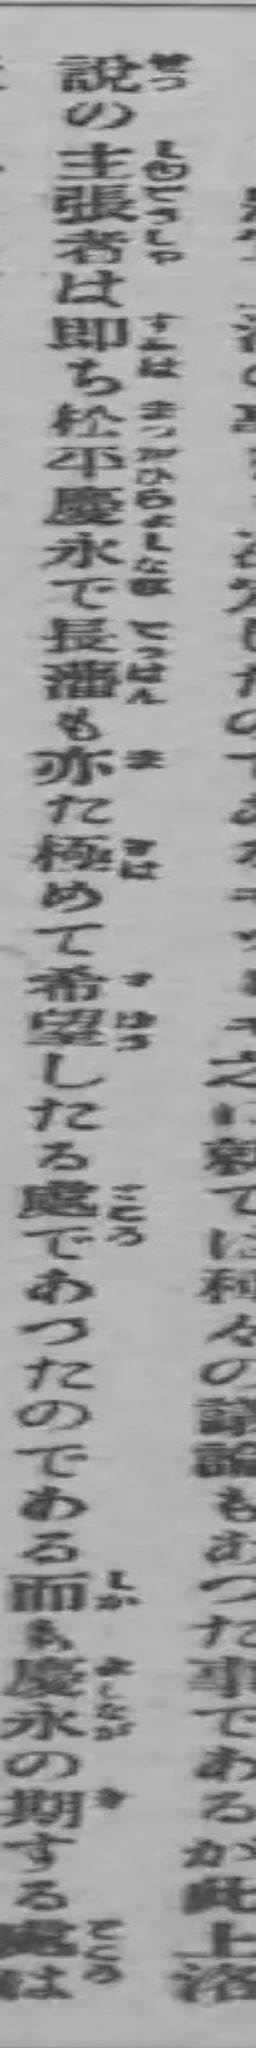説の主張者は即ち松平慶永で長藩も亦た極めて希望したる処であつたのである而も慶永の期する処は
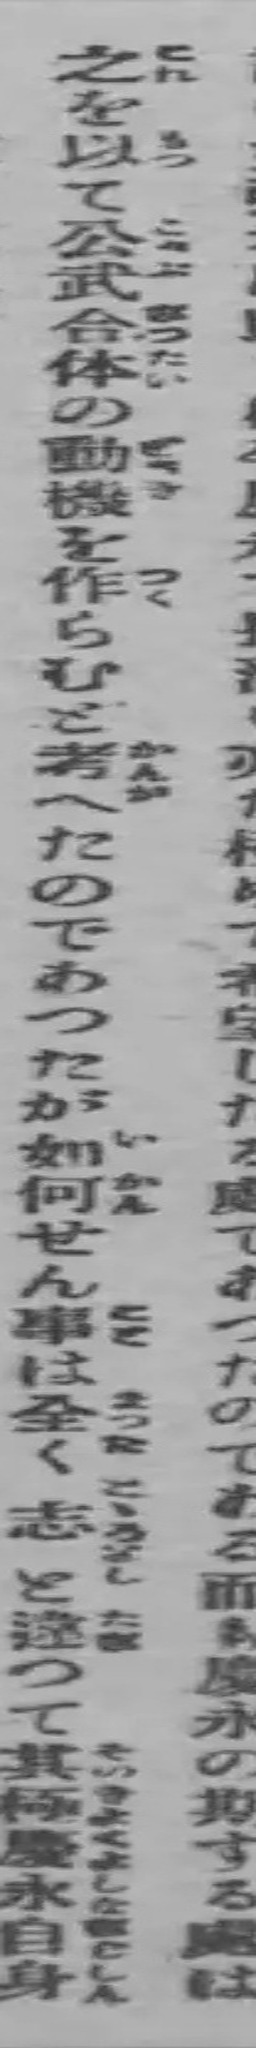之を以て公武合体の動機を作らむと考へたのであつたが如何せん事は全く志と違つて其極慶永自身
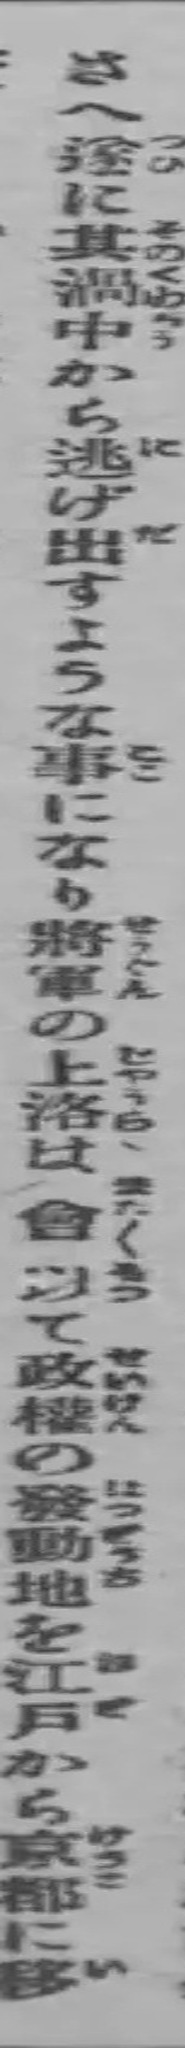さへ遂に其渦中から逃げ出すような事になり将軍の上洛は会以て政権の発動地を江戸から京都に移
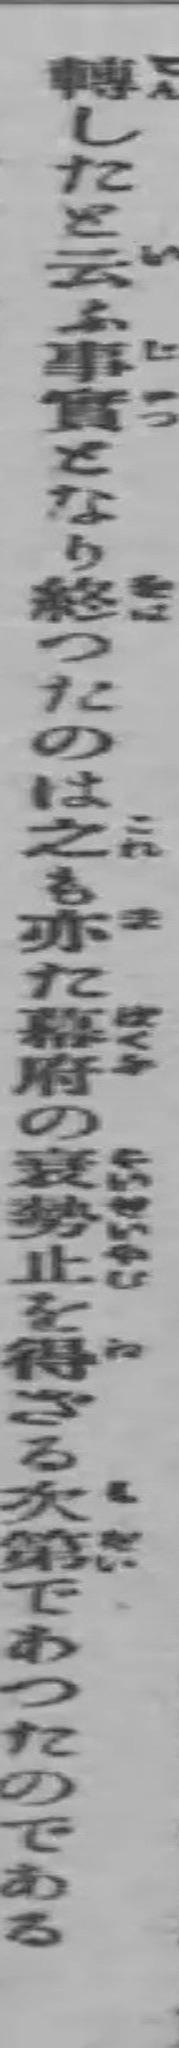転したと云ふ事実となり終つたのは之も亦た幕府の衰勢止を得ざる次第であつたのである
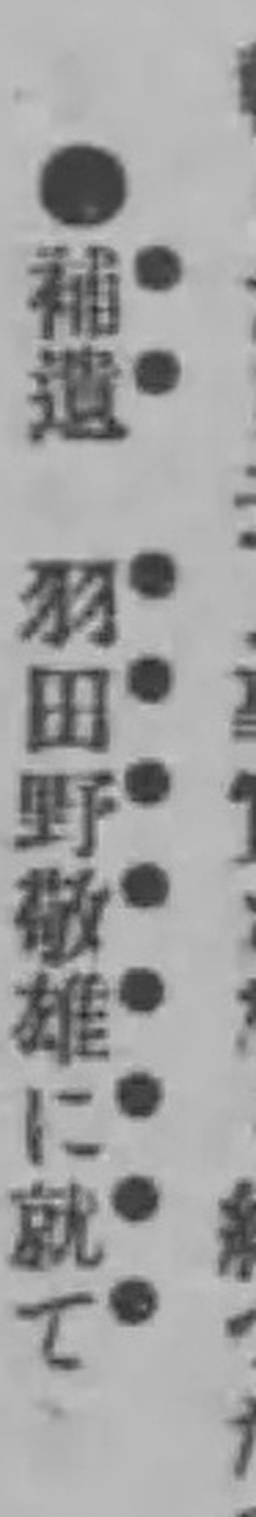●補遺羽田野敬雄に就て
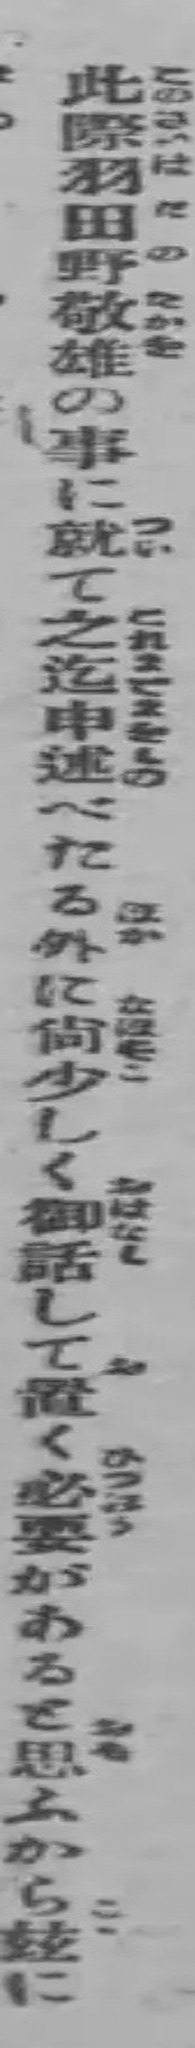此際羽田野敬雄の事に就て之迄申述べたる外に尚少しく御話して置く必要があると思ふから茲に
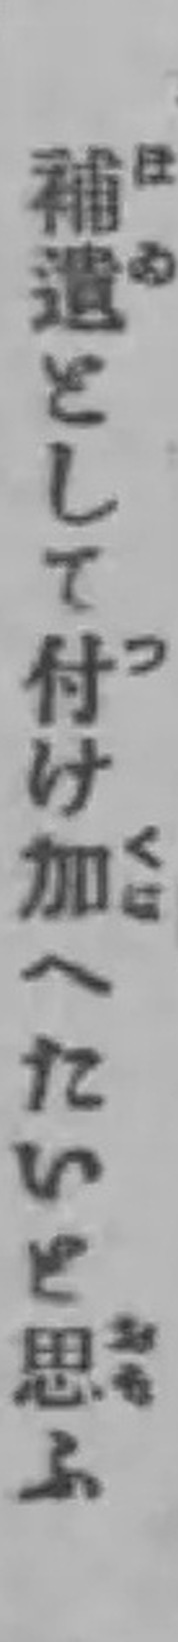補遺として付け加へたいと思ふ
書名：豊橋市史談
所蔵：国立国会図書館 National Diet Library, JAPAN
